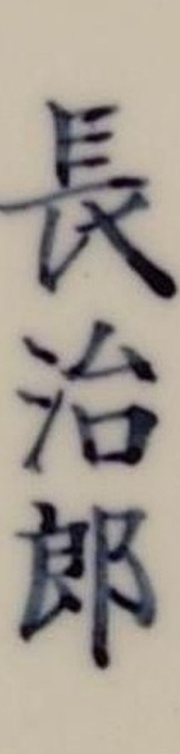長治郎
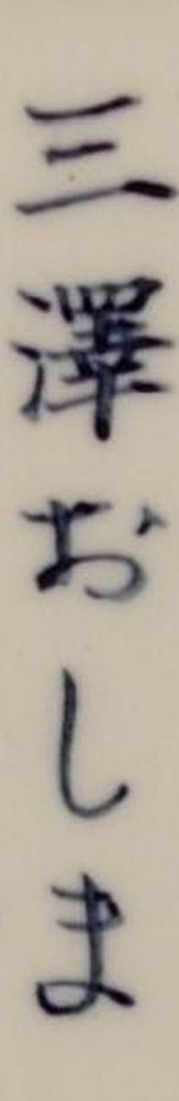三澤おしま
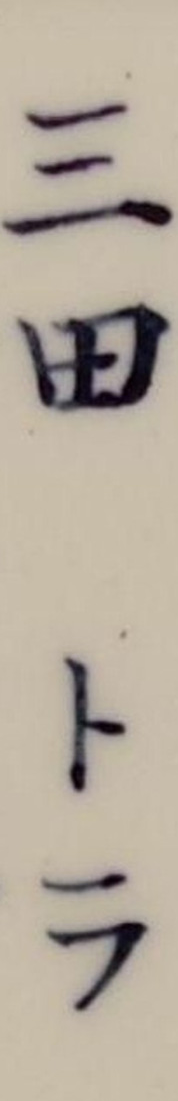三田トラ
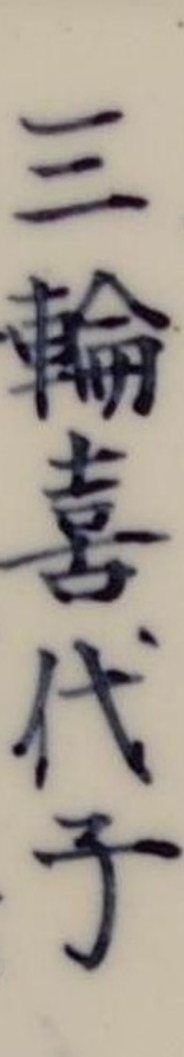三輪喜代子
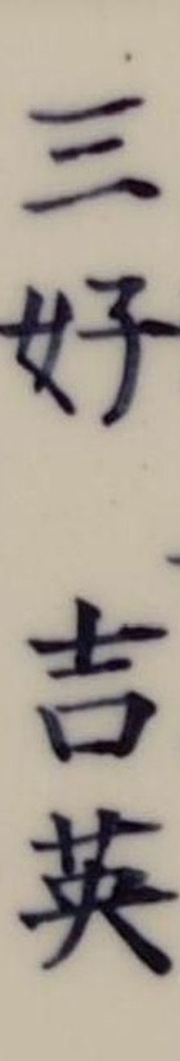三好吉英
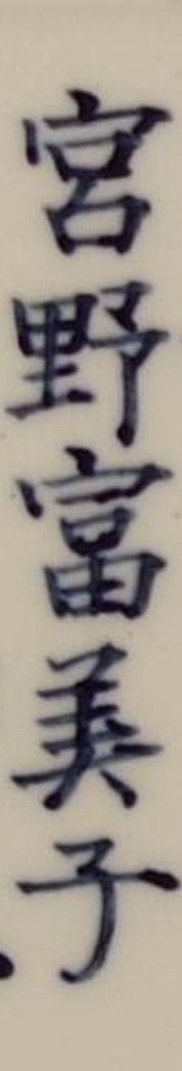宮野富美子
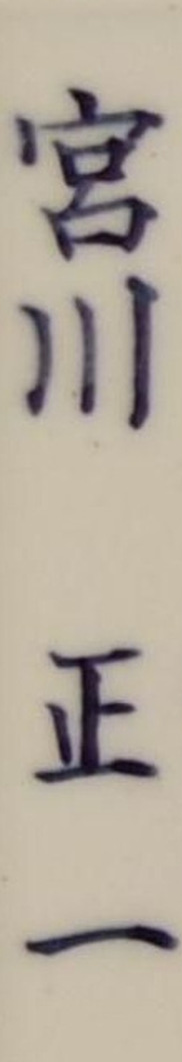宮川正一

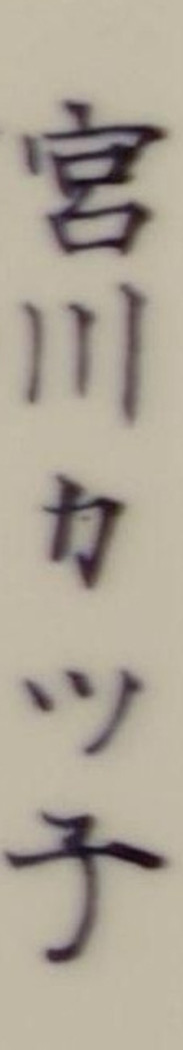宮川カツ子
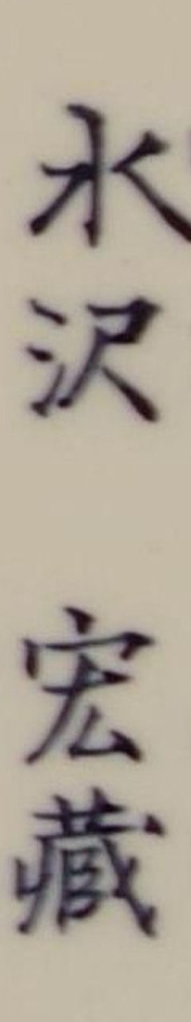水沢宏蔵
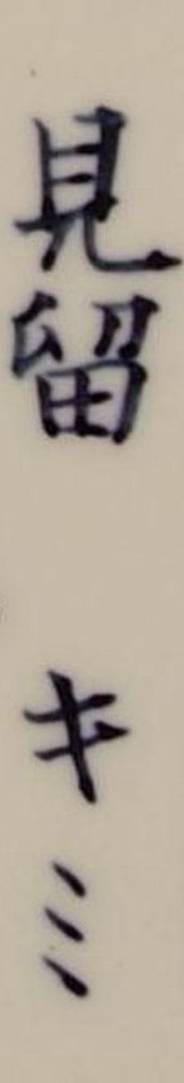見留キミ
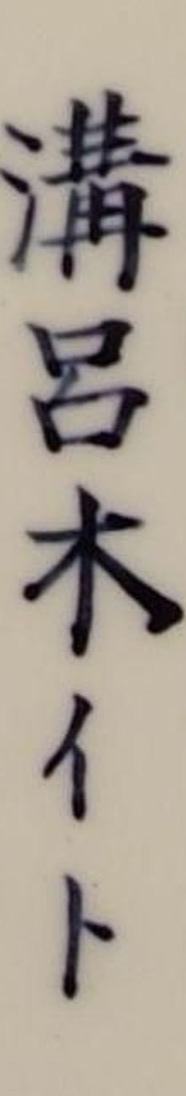溝呂木イト
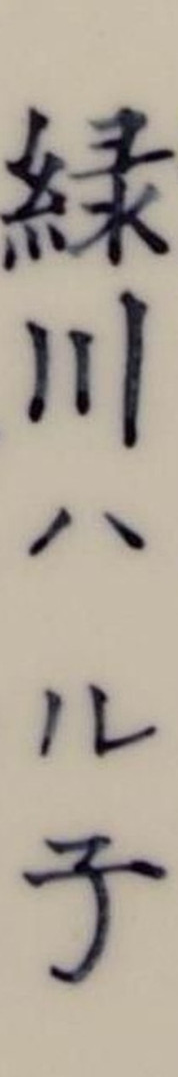緑川ハル子
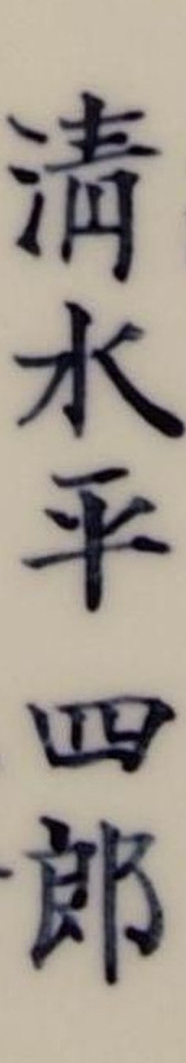清水平四郎
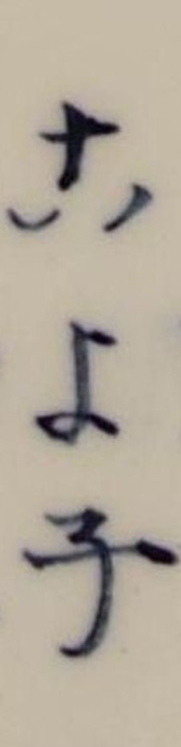こよ子
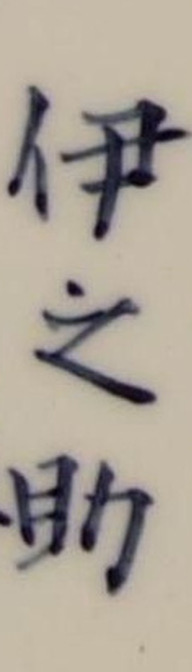伊之助
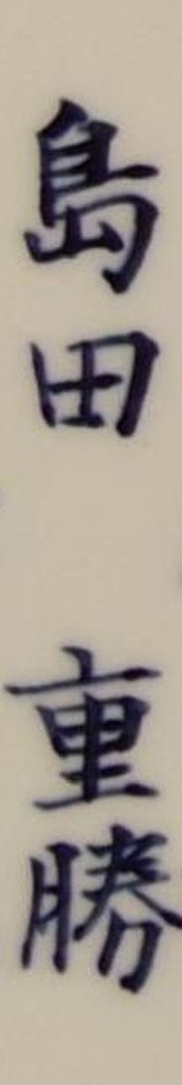島田重勝
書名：M~S
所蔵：高野山金剛峯寺
